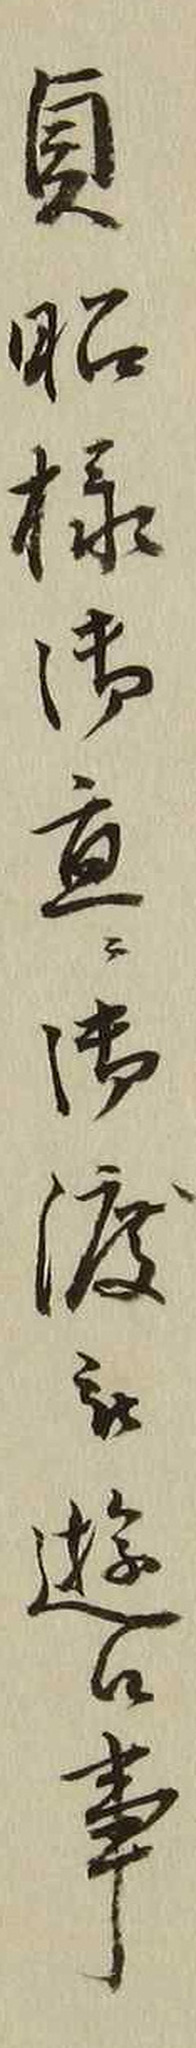貞昭様御直に御渡被遊候事
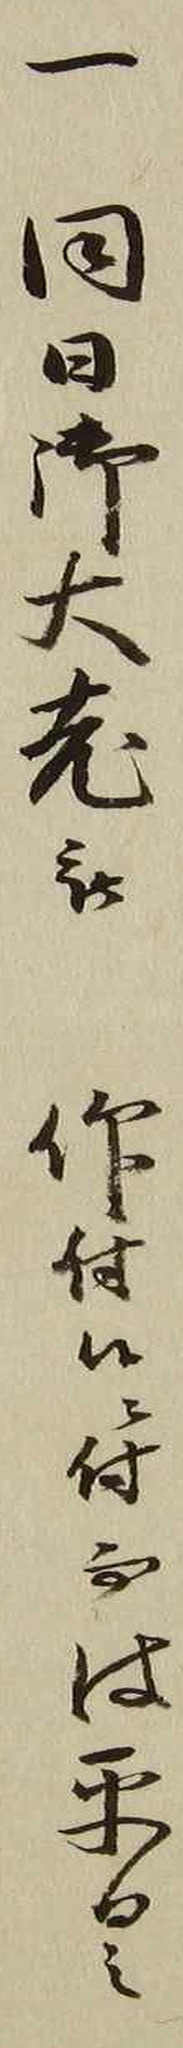一同日御大老被仰付候に付而は平日之
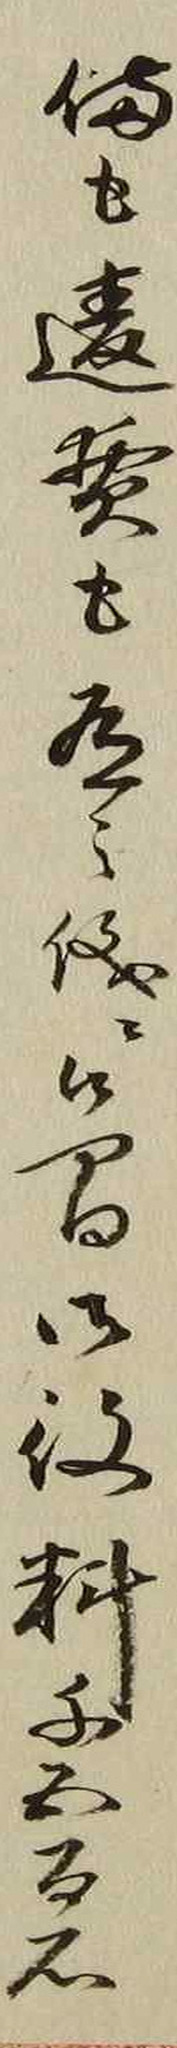備も違費も有之儀に候間御役料千五百石
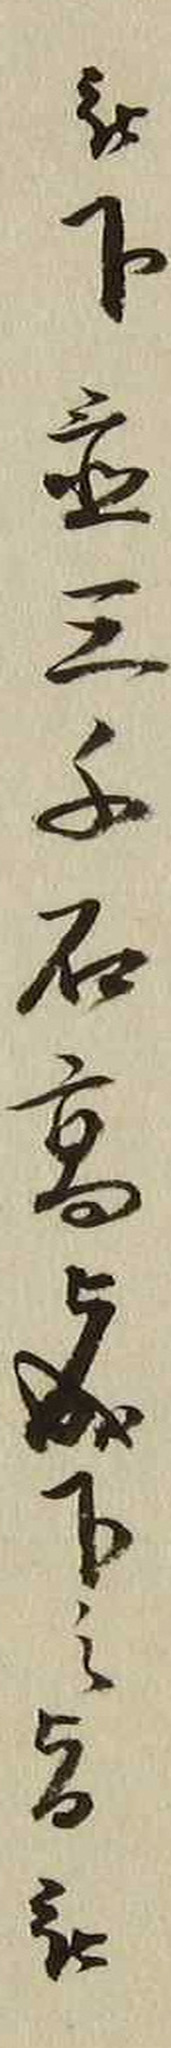被下置三千石高被成下之旨被
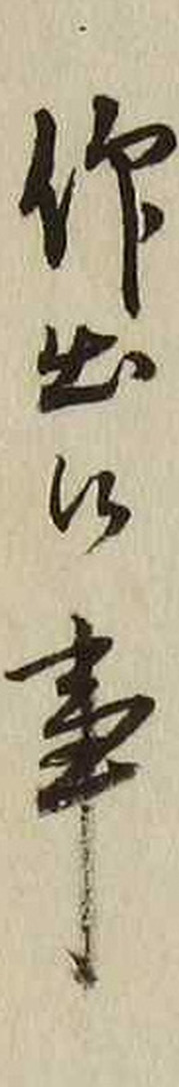仰出候事
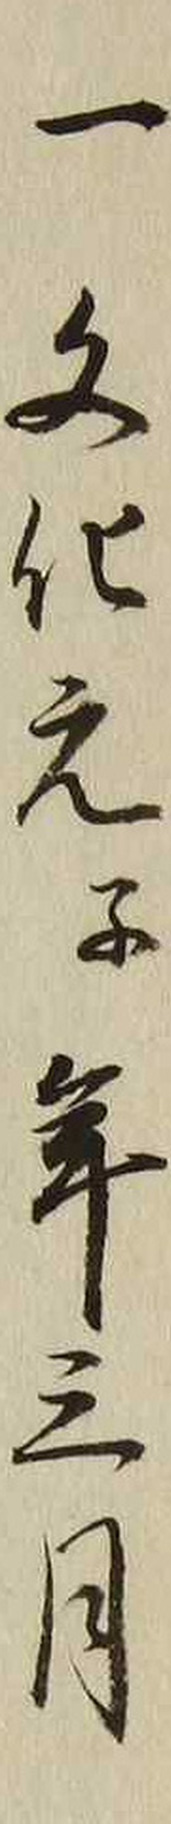一文化元子年三月
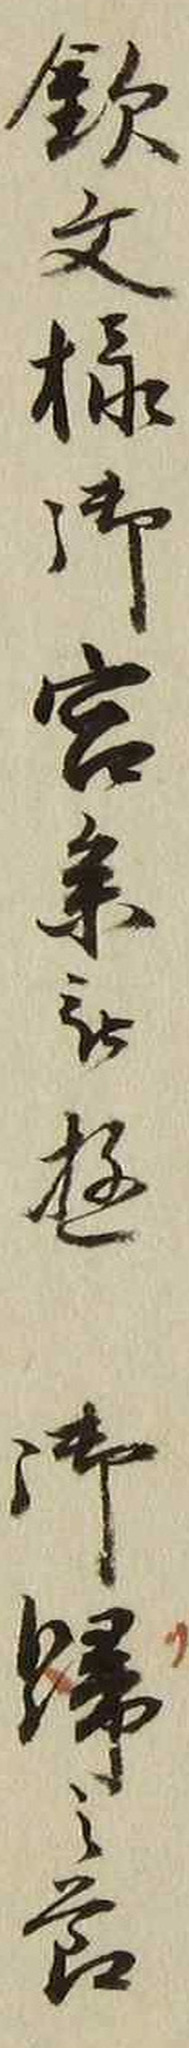欽文様御宮参被遊御帰之節
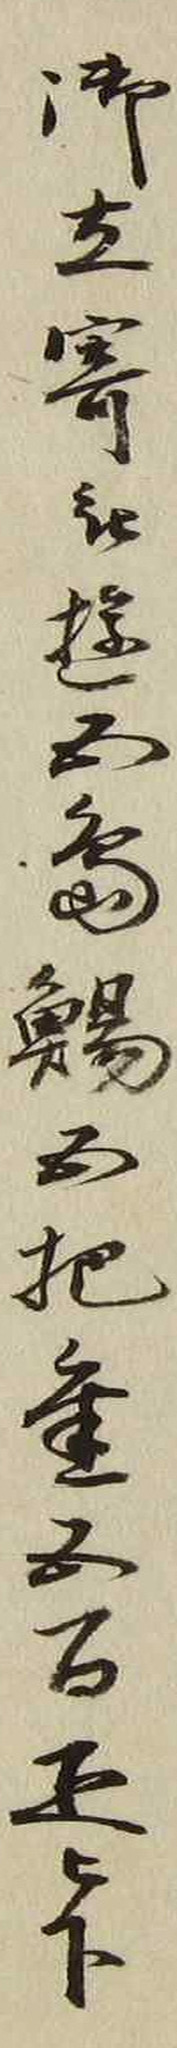御立寄被遊五嶋鯣五把金五百疋被下
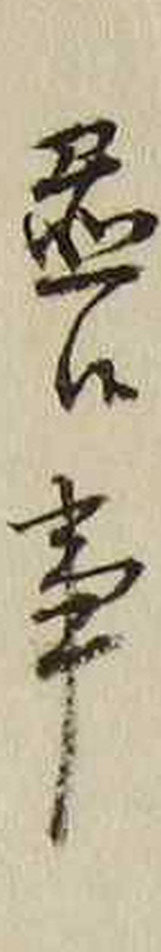置候事
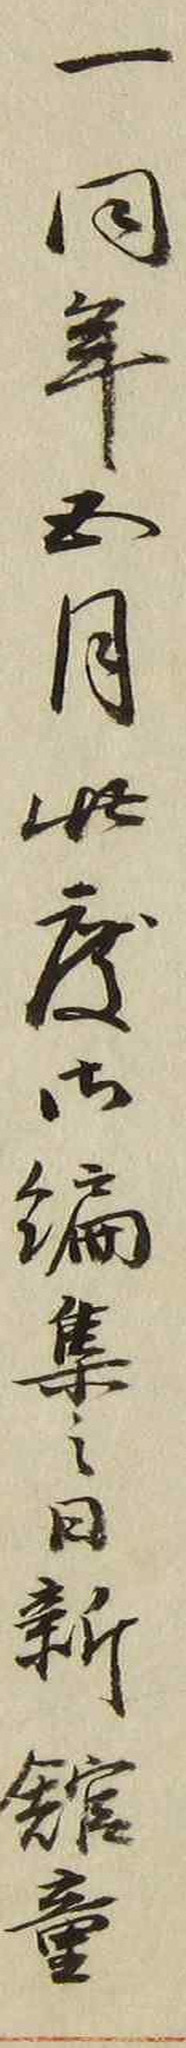一同年五月此度編集之日新館童
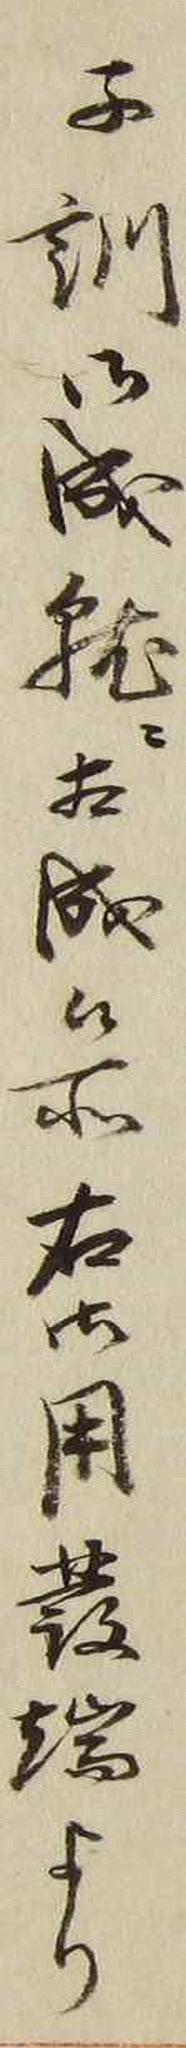子訓御成就に相成候所右御用発端より
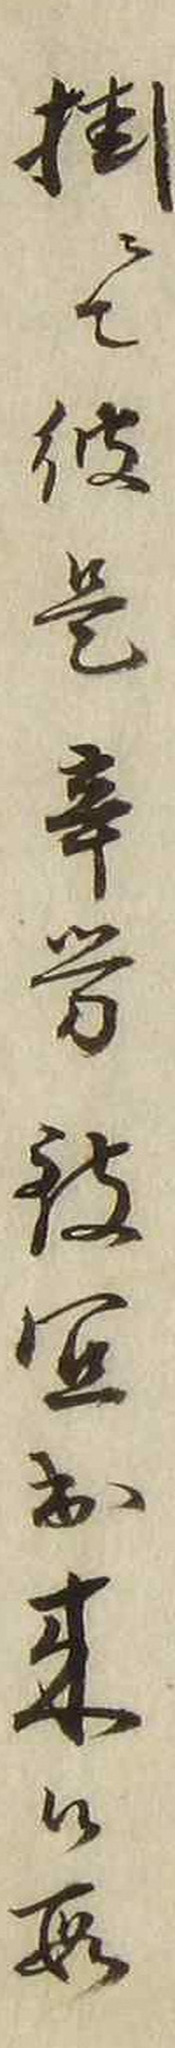掛にて彼是辛労致宜出来候段

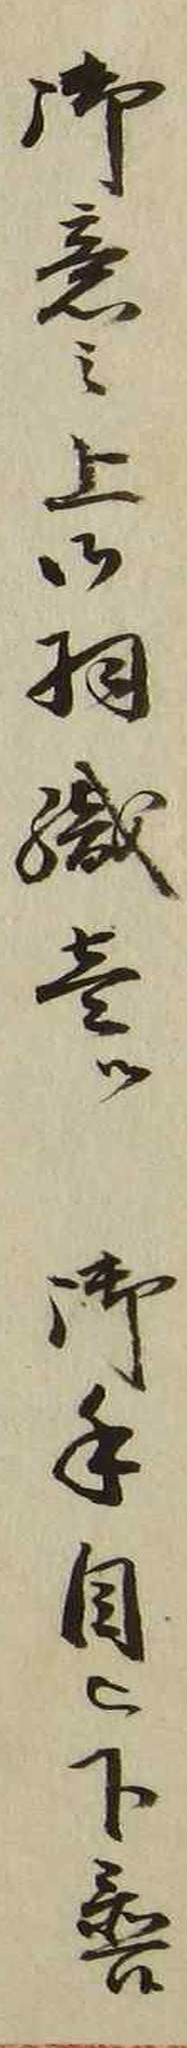御意之上御羽織壱つ御手自被下置候
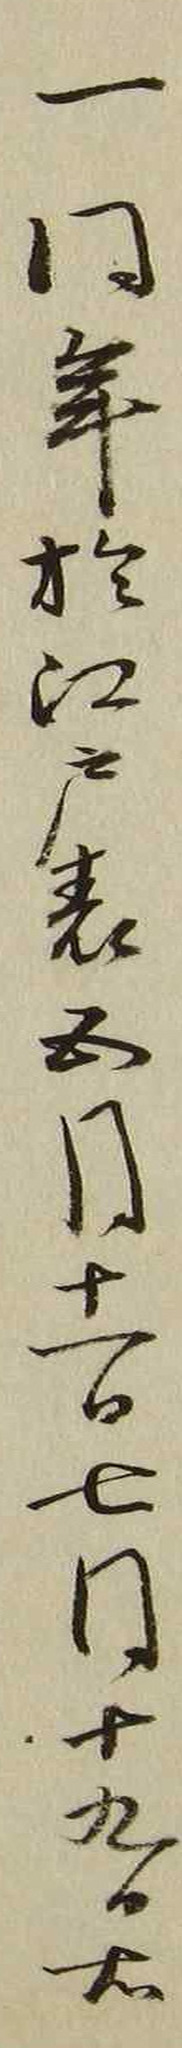一同年於江戸表五月十一日七月十九日左
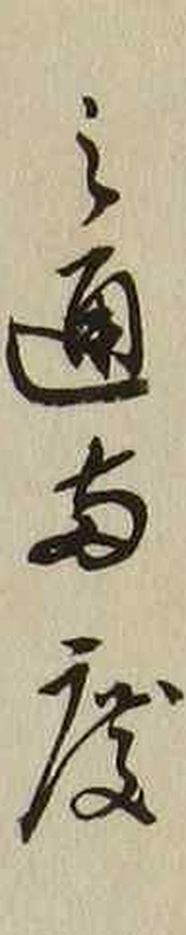之通両度
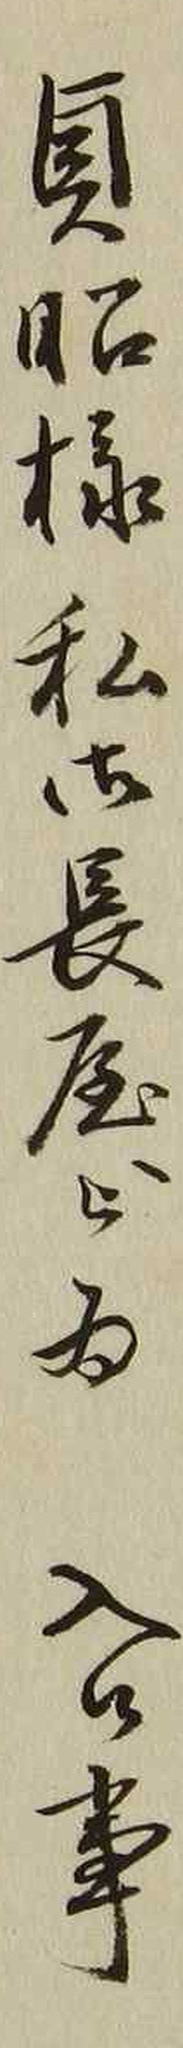貞昭様私御長屋へ被為入候事
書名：諸士系譜　巻之125　た之部1
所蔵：会津若松市立会津図書館
